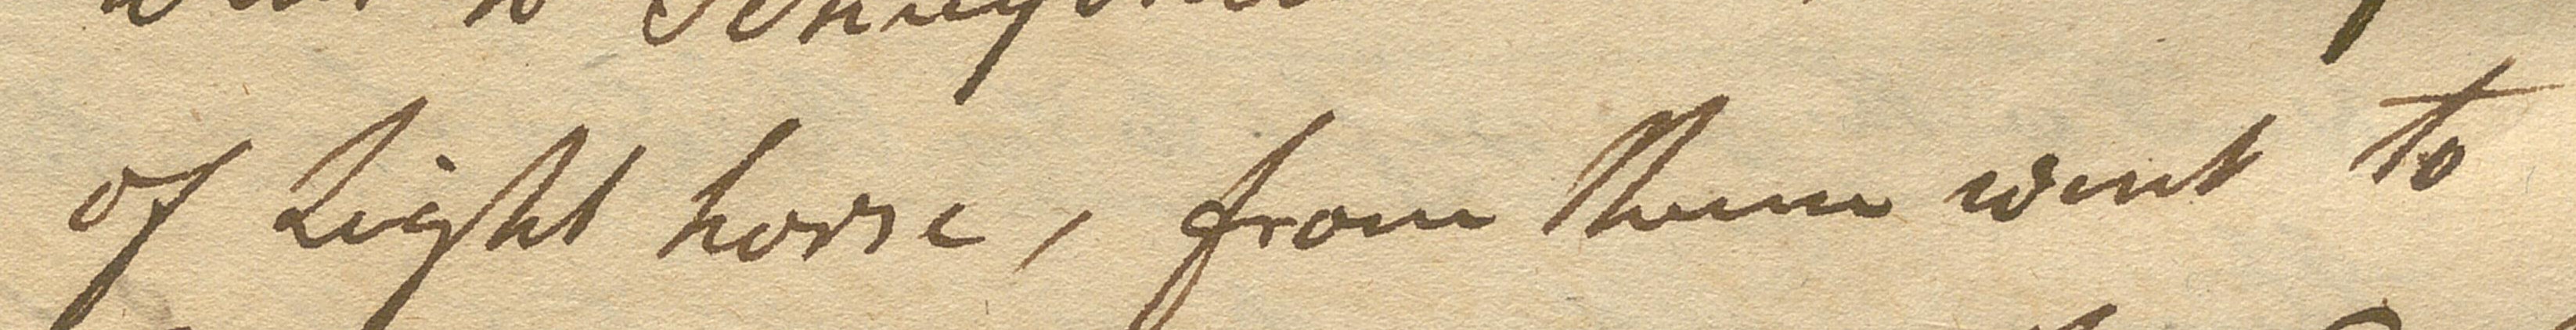of Light horse, from thence went to
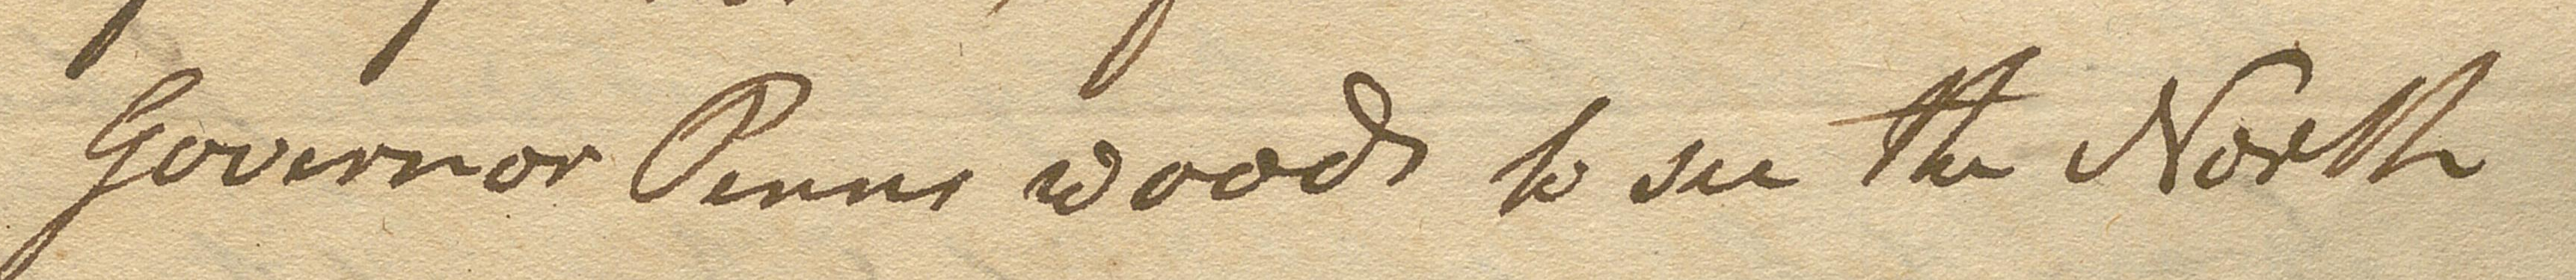Governor Penns woods to see the North
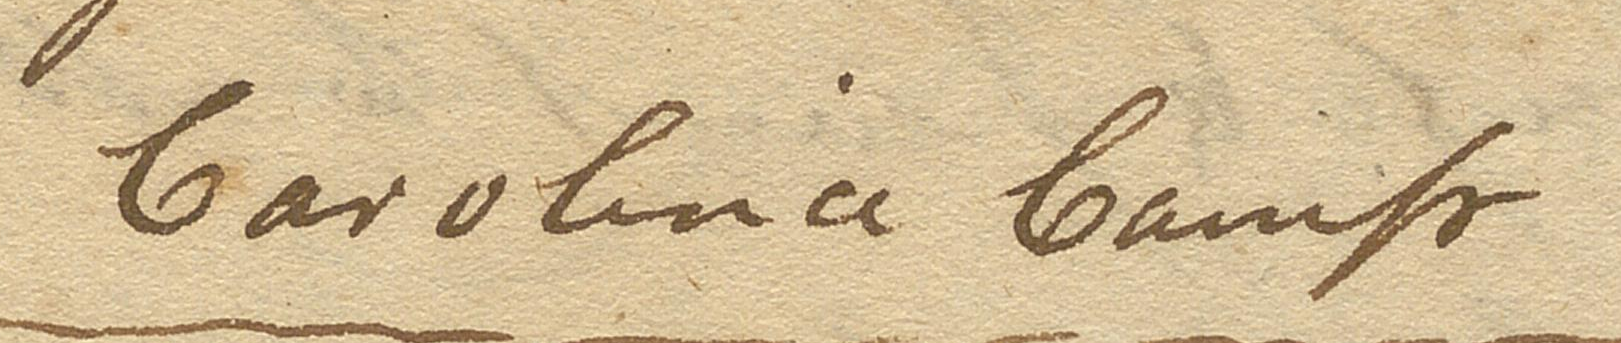Carolina Camp
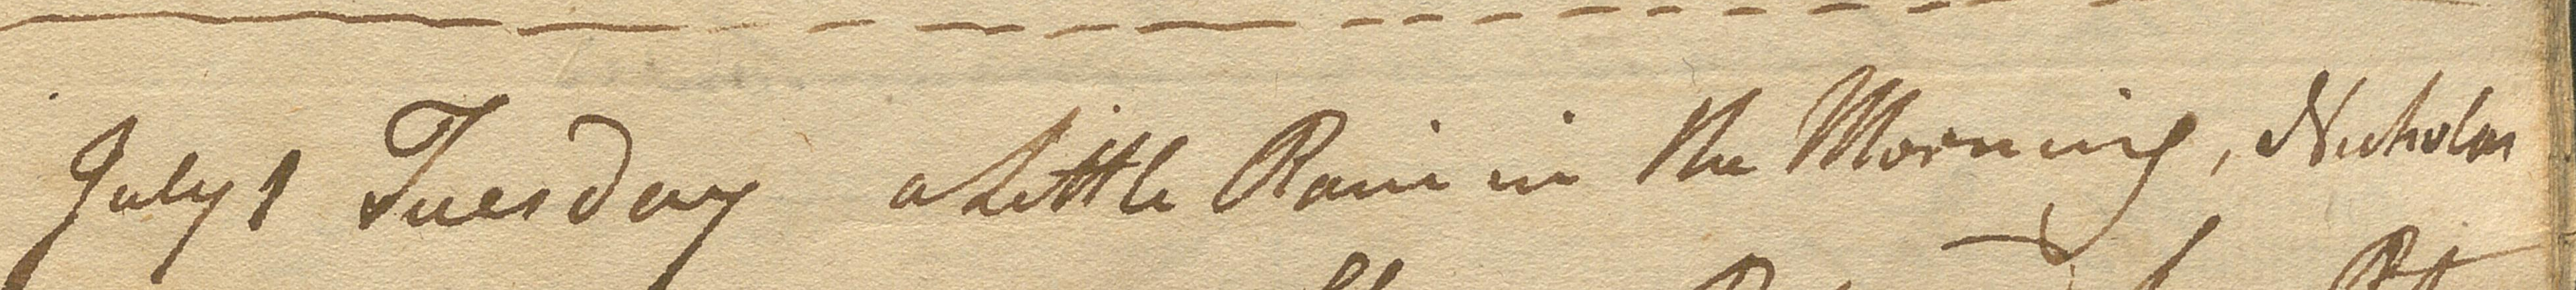July 1 Tuesday a Little Rain in the Morning, Nicholas
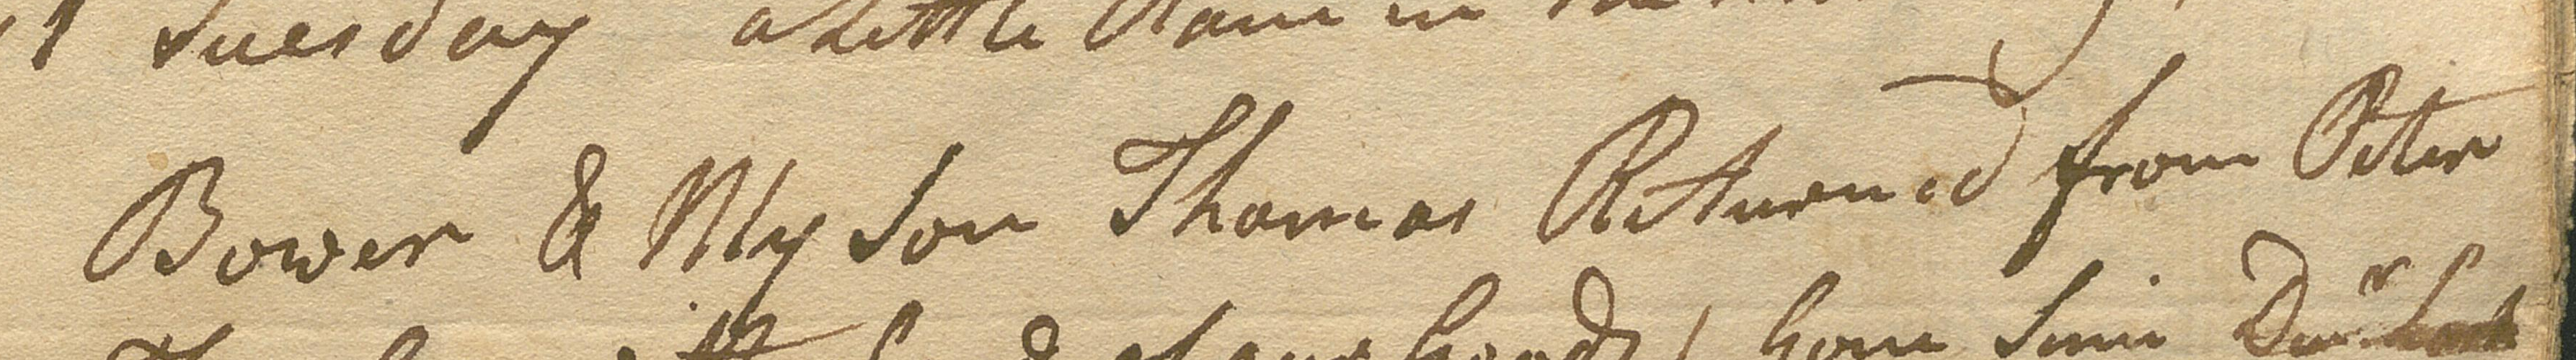Bower & My Son Thomas Returned from Peter
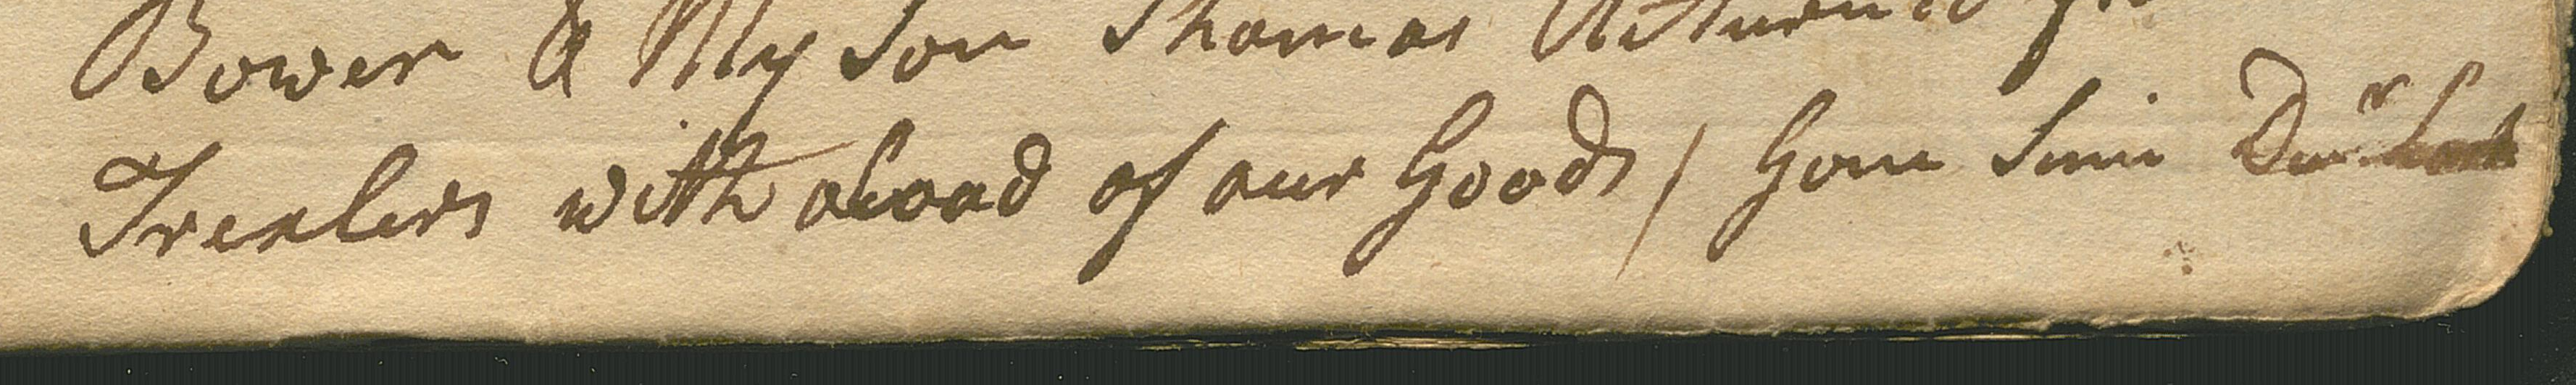Trenlers with a load of our Goods / Gone Since Dur^r Lark
